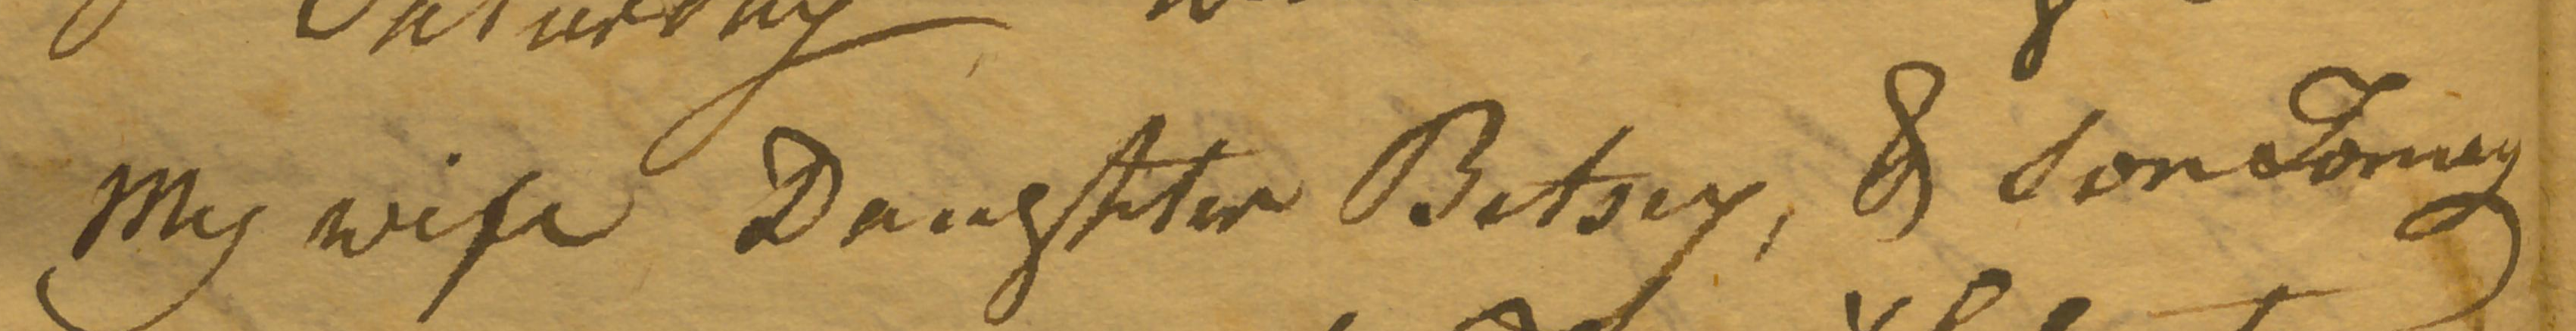My wife Daughter Betsey, & son Tomey
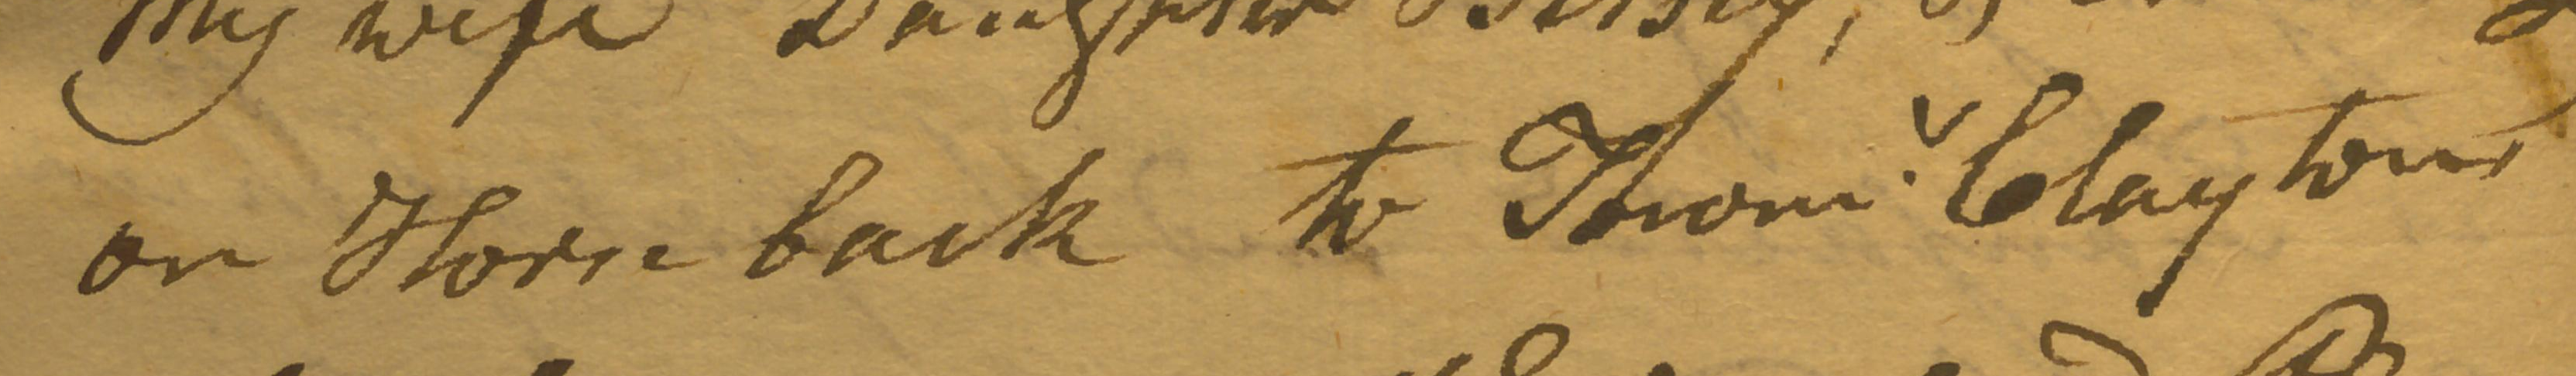on Horse back to Thom^s. Claytons
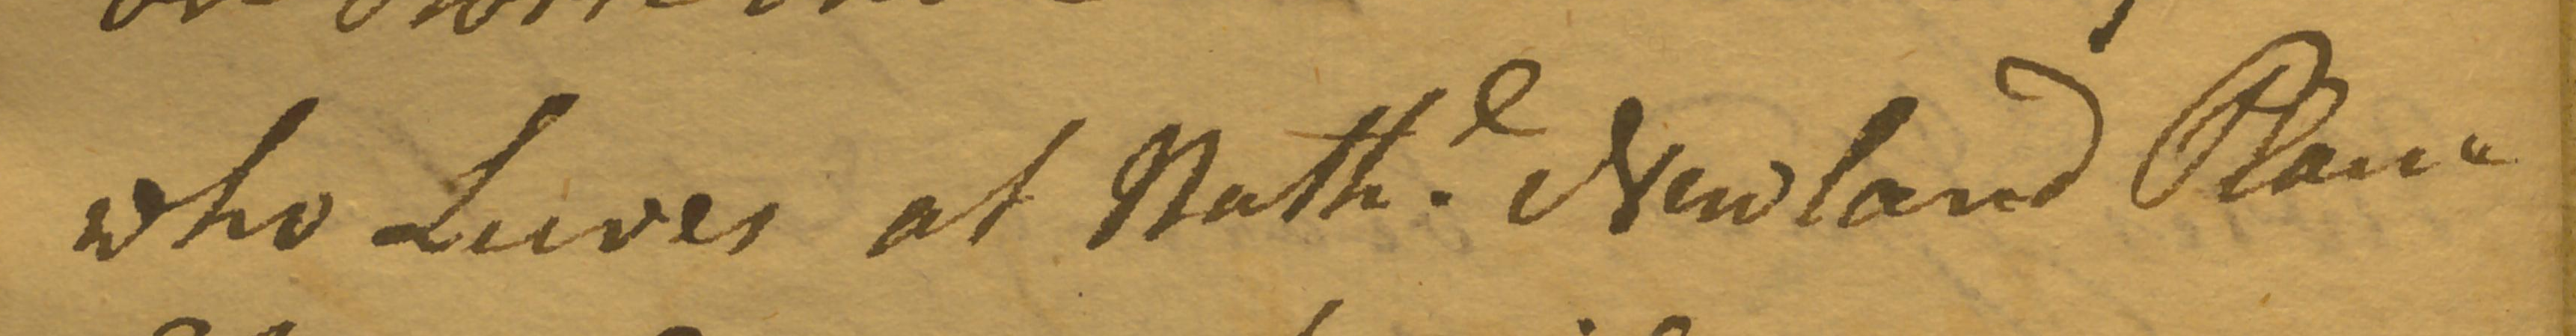who Lieves at Nath^l. Newland Place
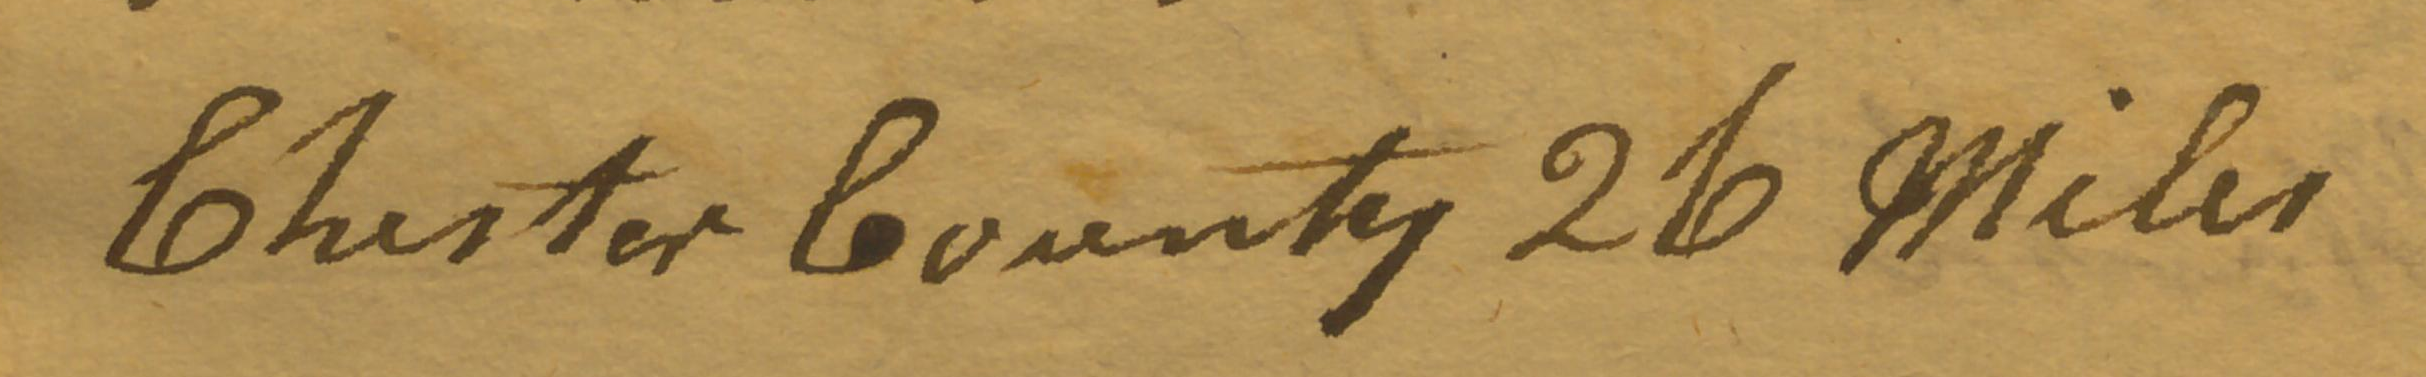Chester County 26 Miles
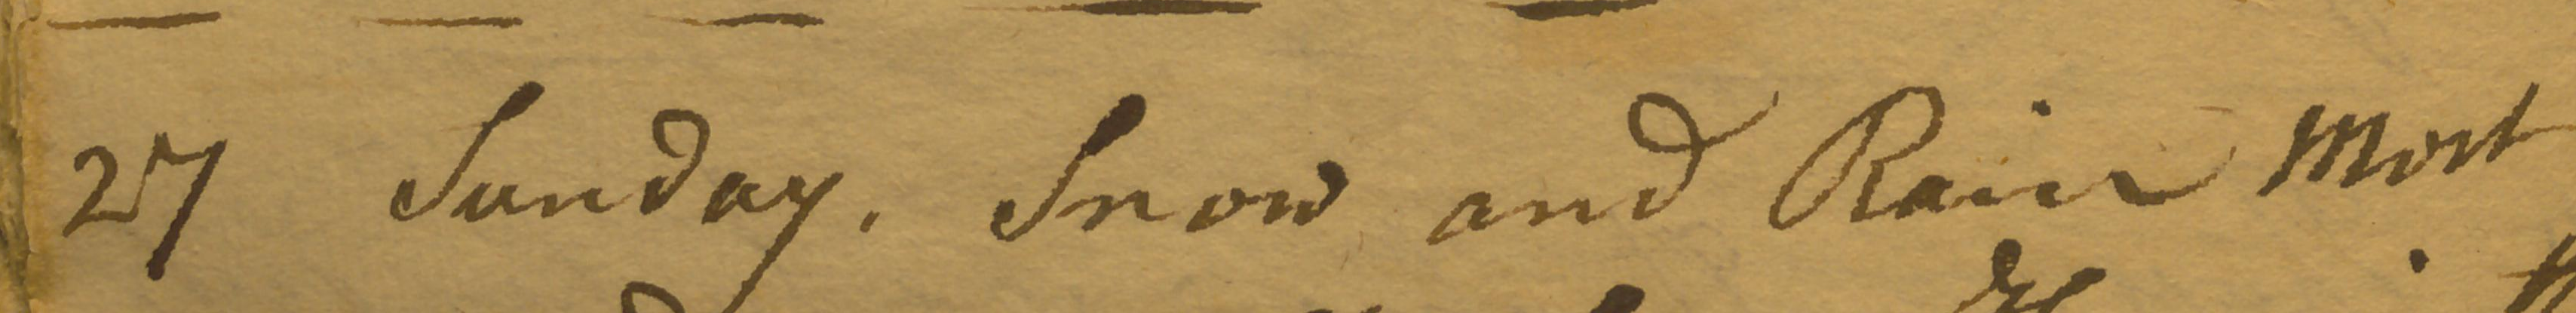27 Sunday. Snow and Rain Most
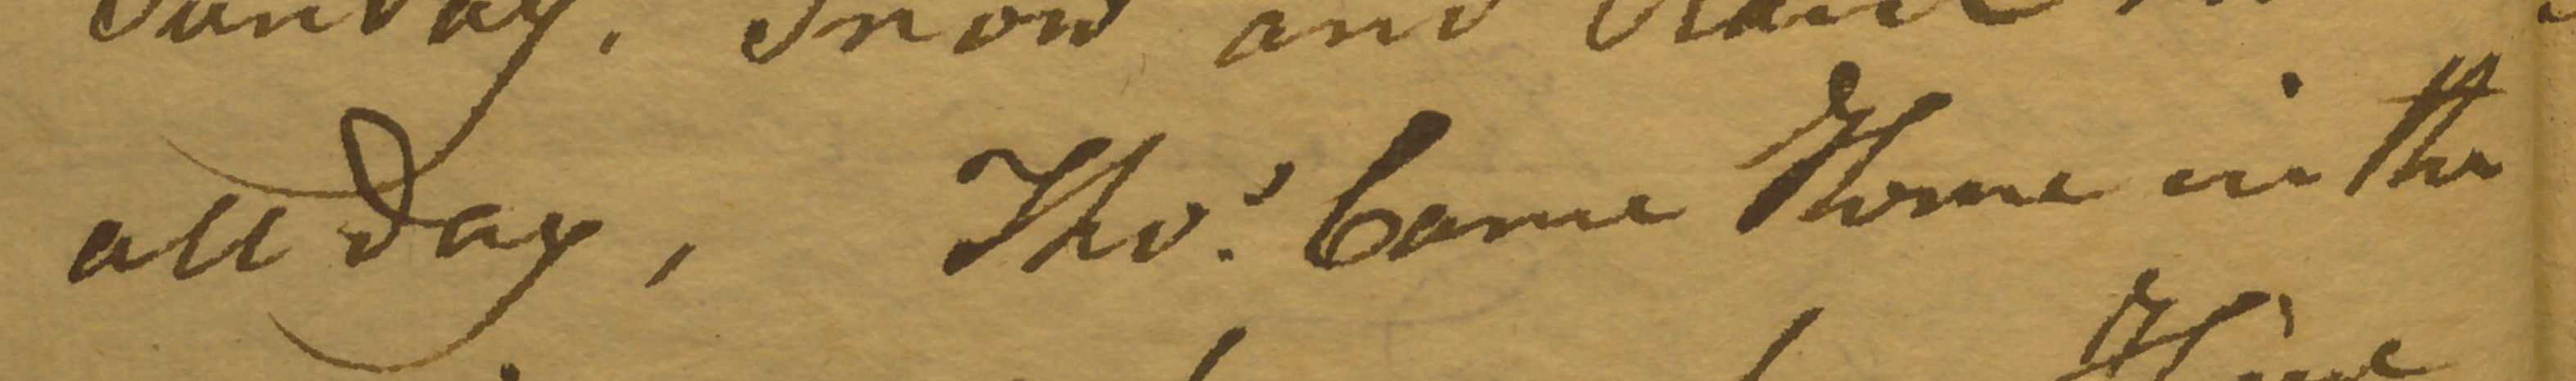all day, Tho^s. Came Home in the
